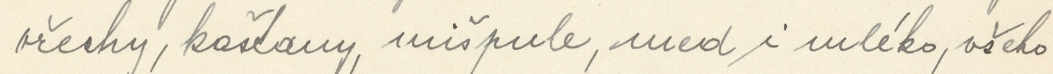ořechy, kaštany, mišpule, med i mléko, všeho
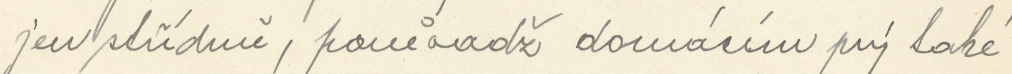jen střídmě, poněvadž domácím prý také
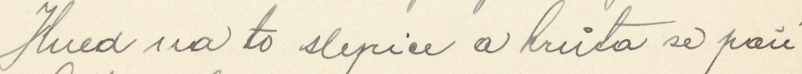Hned na to slepice a krůta se paří
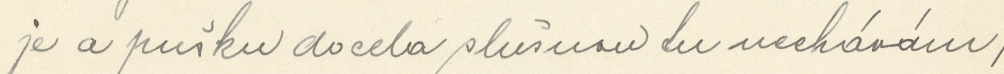je a pušku docela slušnou tu nechávám,
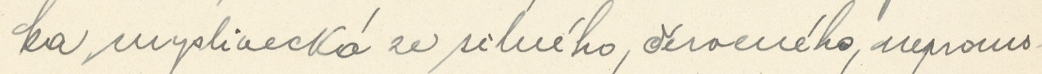ka myslivecká ze silného, červeného, nepromo-
